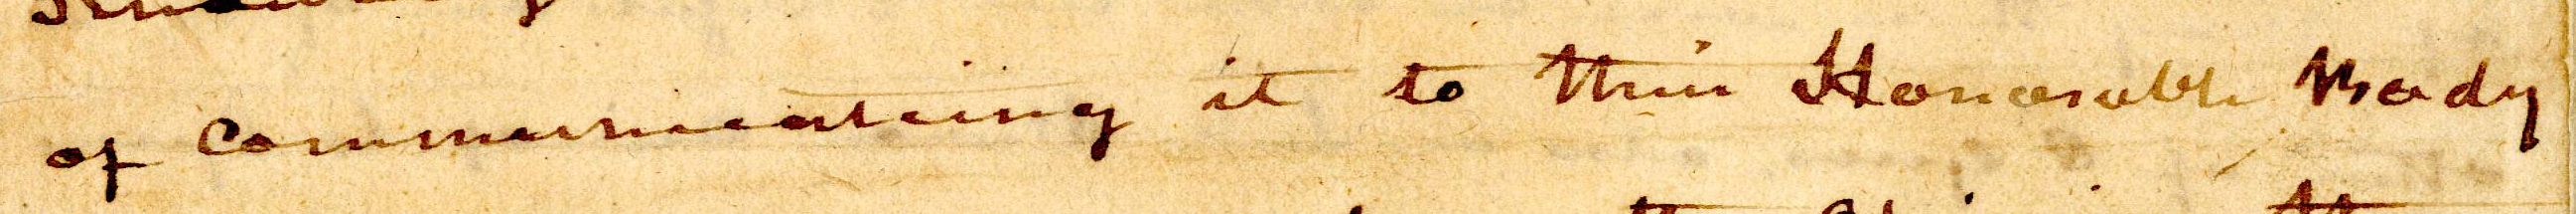of Communicating it to this Honorable Body
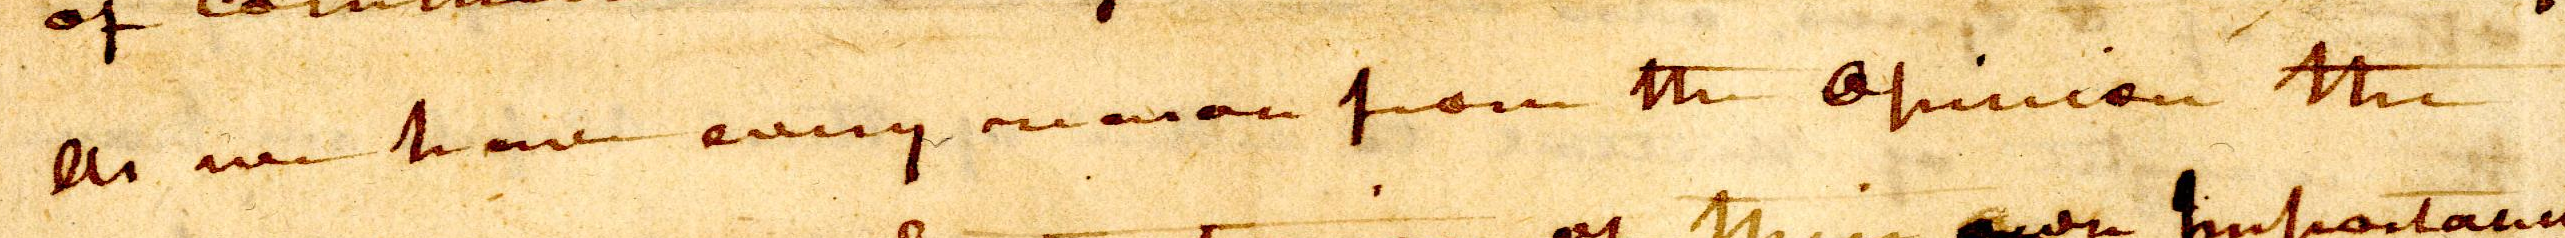as we have every reason from the Opinion the
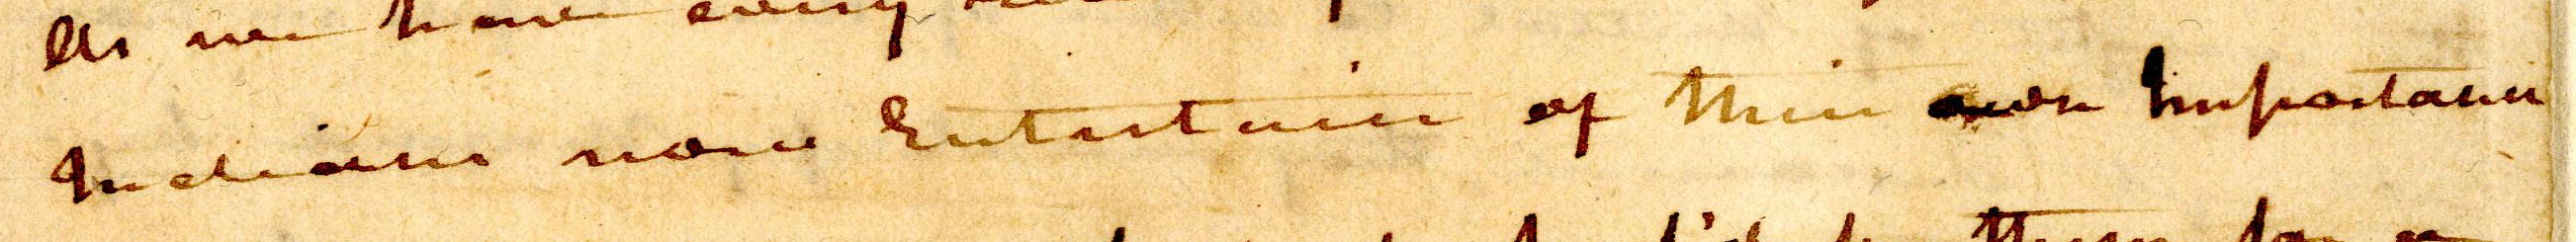Indians now Entertain of their own Importance
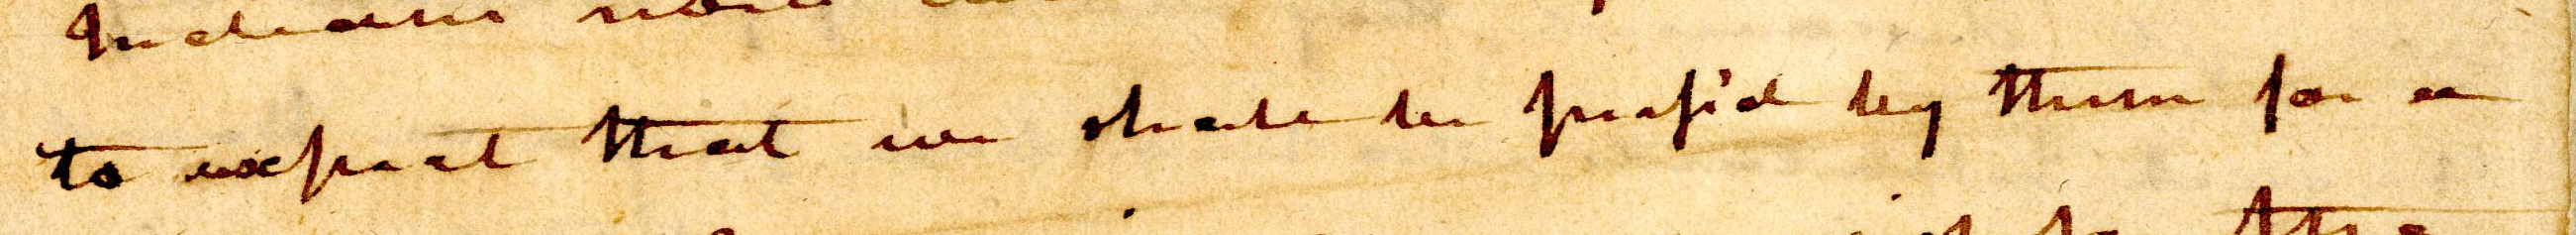to expect that we shall be pressed by them for a
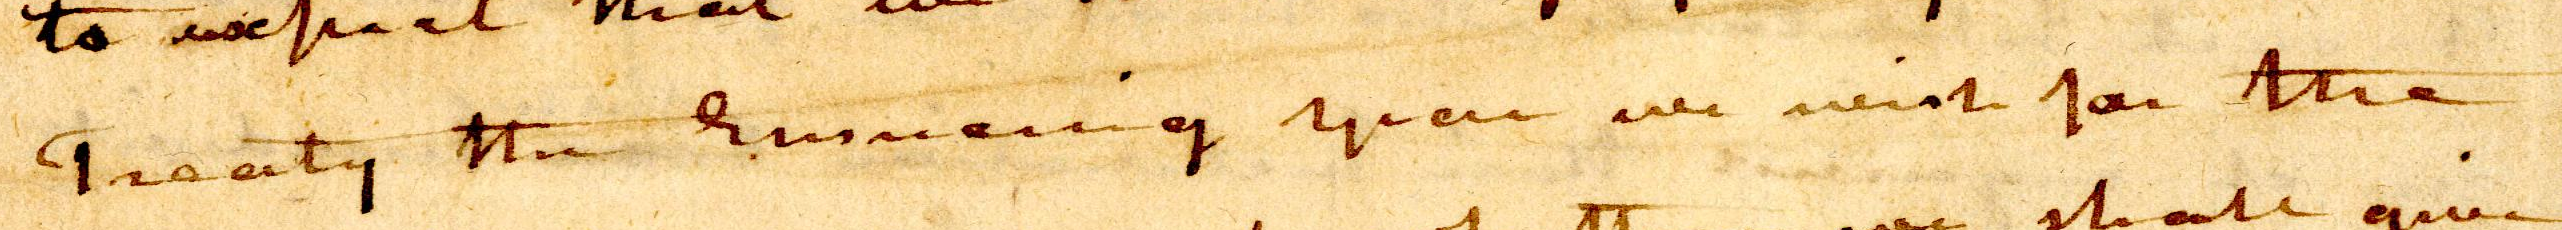Treaty the Ensuing Year we wish for the
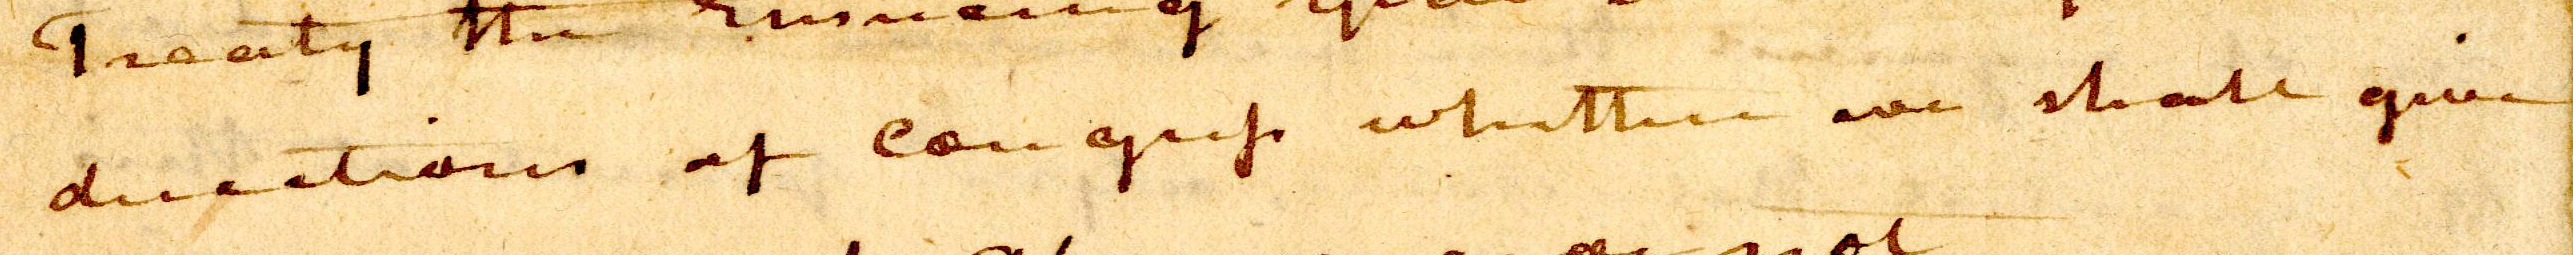directions of Congress whether we shall give
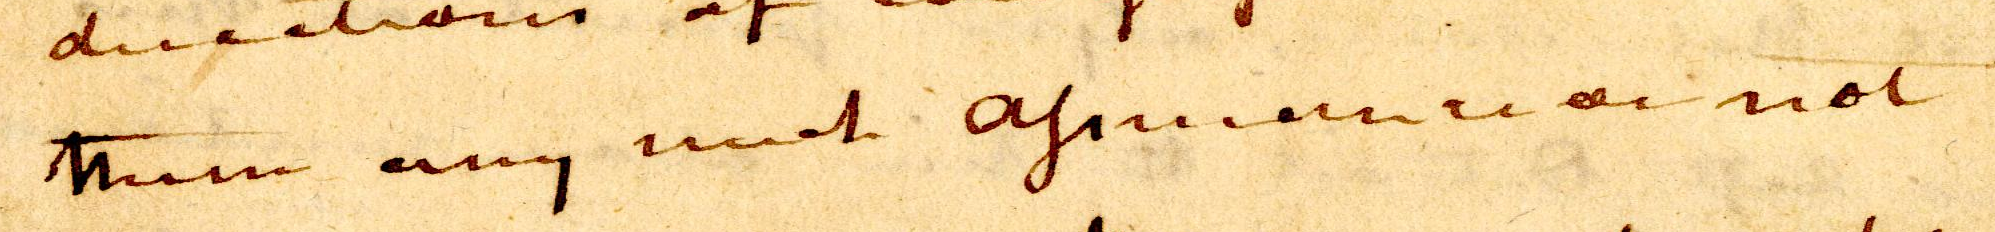them any such Assurance or not
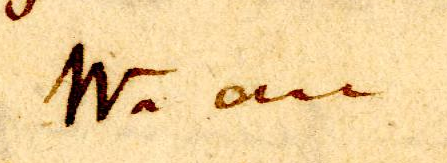We are
